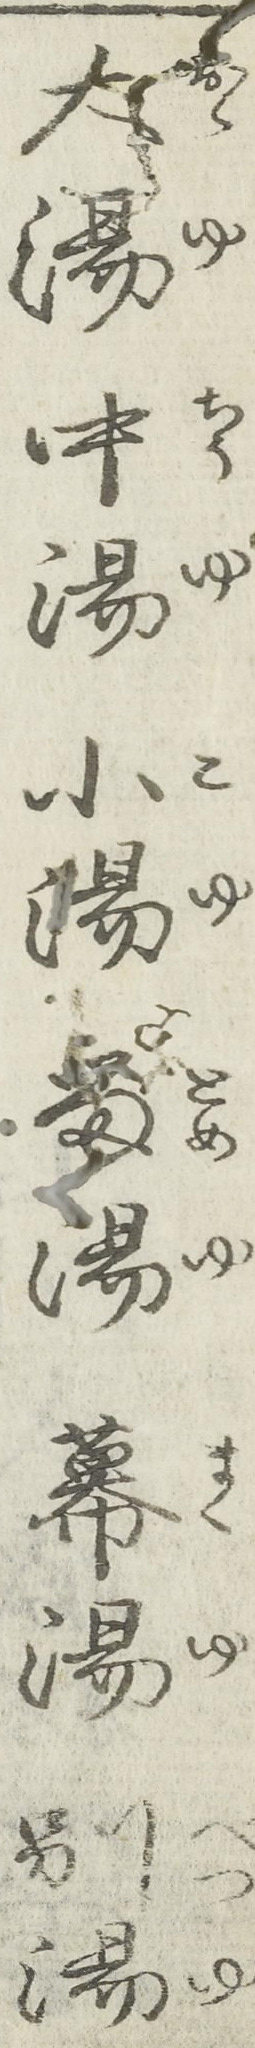大湯中湯小湯留湯幕湯別湯
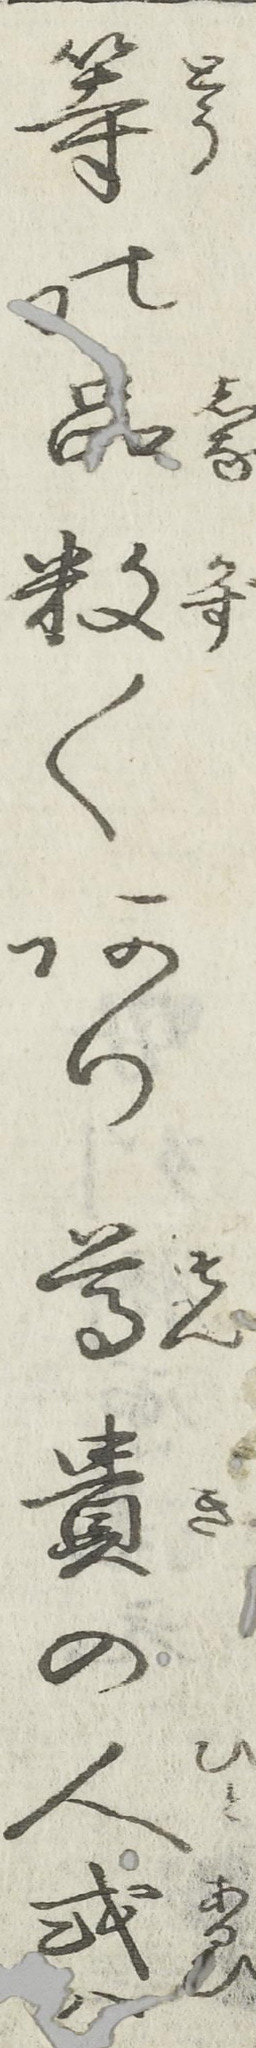等の品数〱あり尊貴の人或は
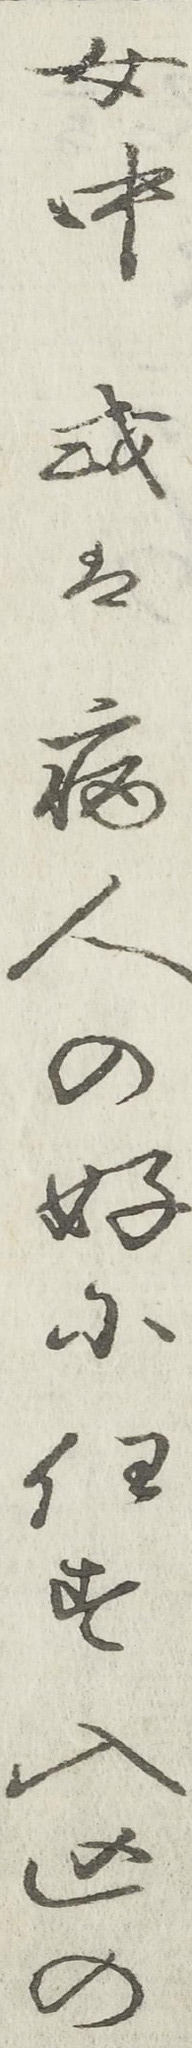女中或は病人の好に任す入込の
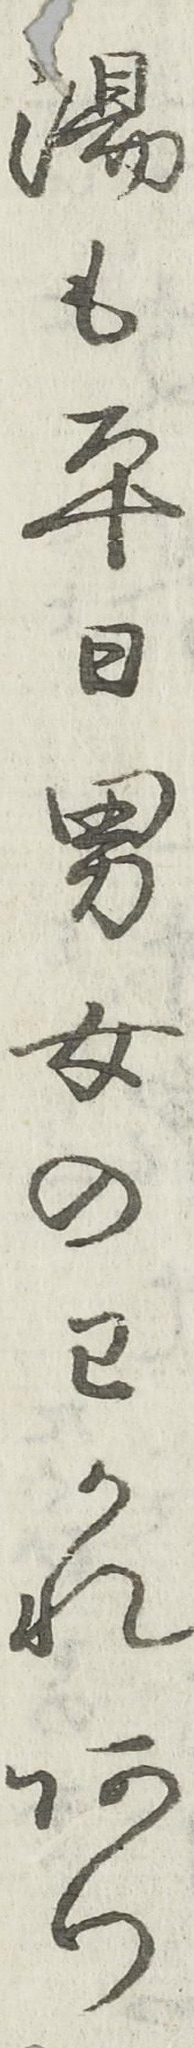湯も平日男女のわかれあり
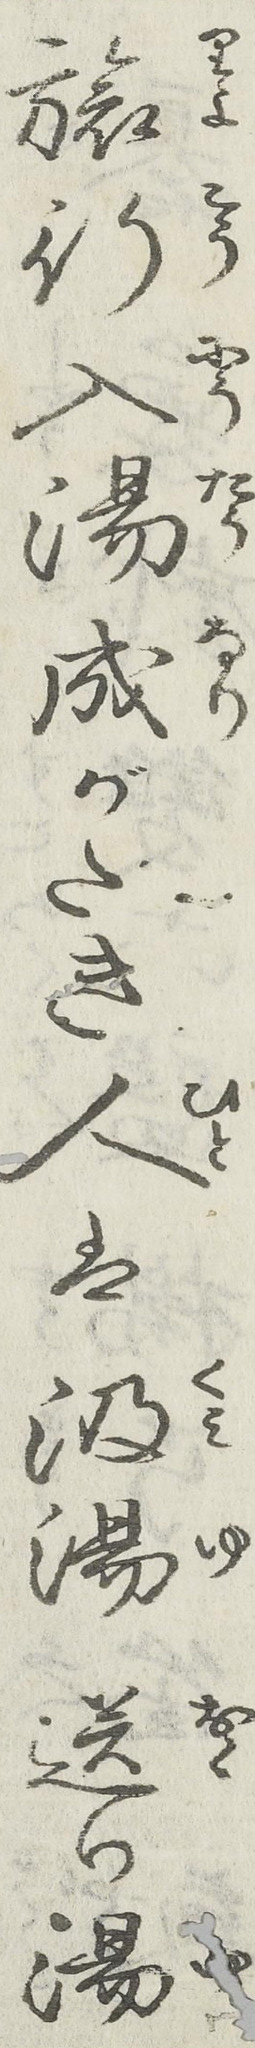旅行入湯成がたき人は汲湯送り湯
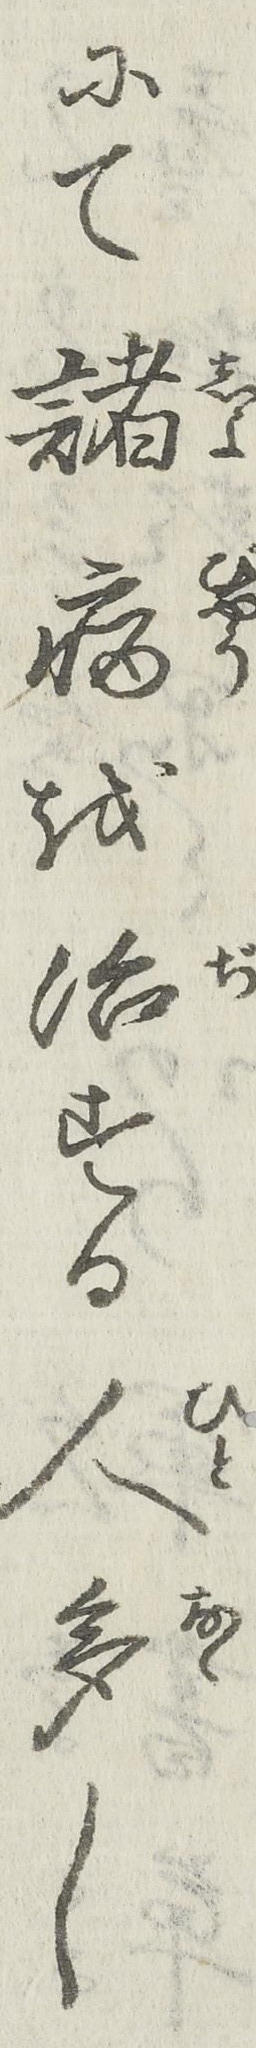にて諸病を治する人多し
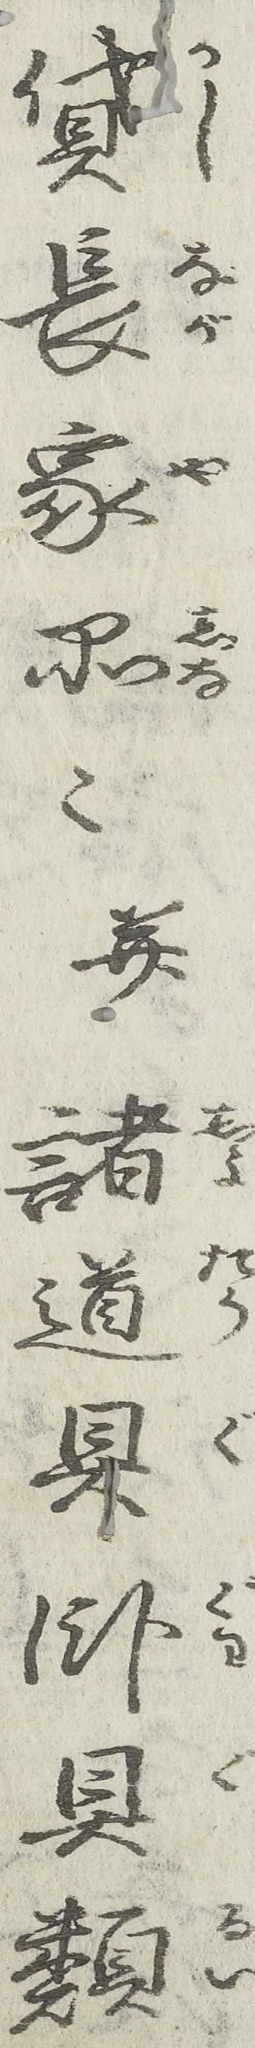貸長屋品々并諸道具臥具類

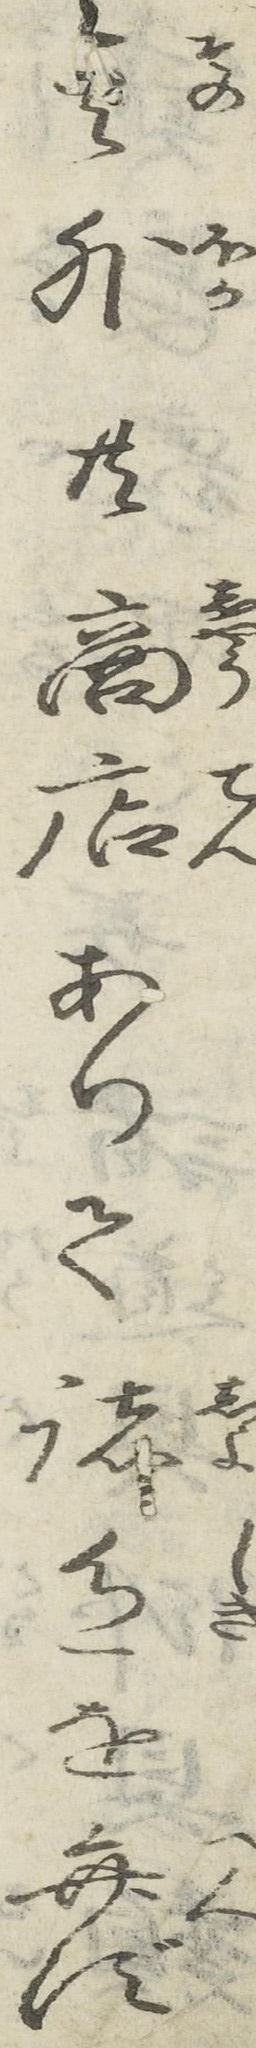其外に商店ありて諸色を弁ず
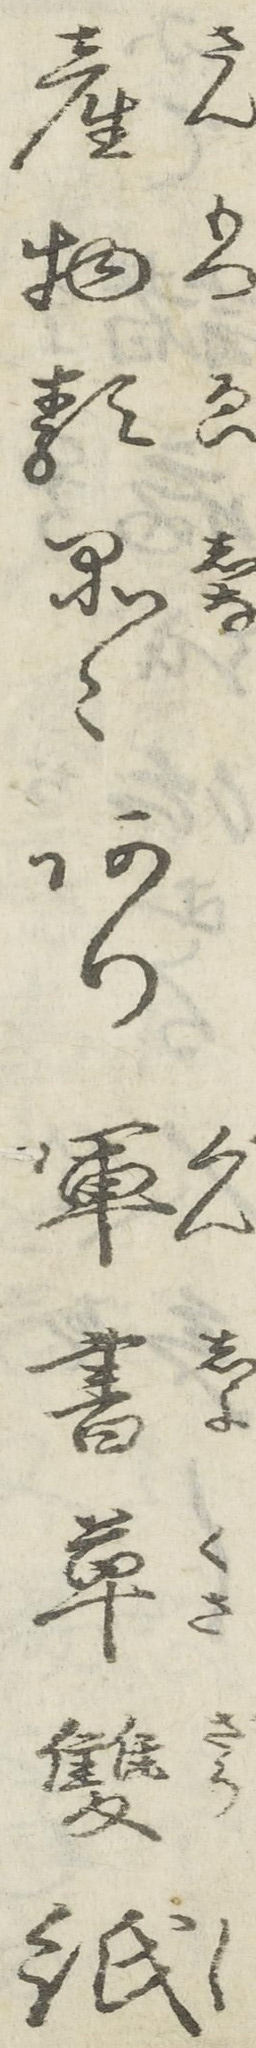産物類品々あり軍書草雙紙
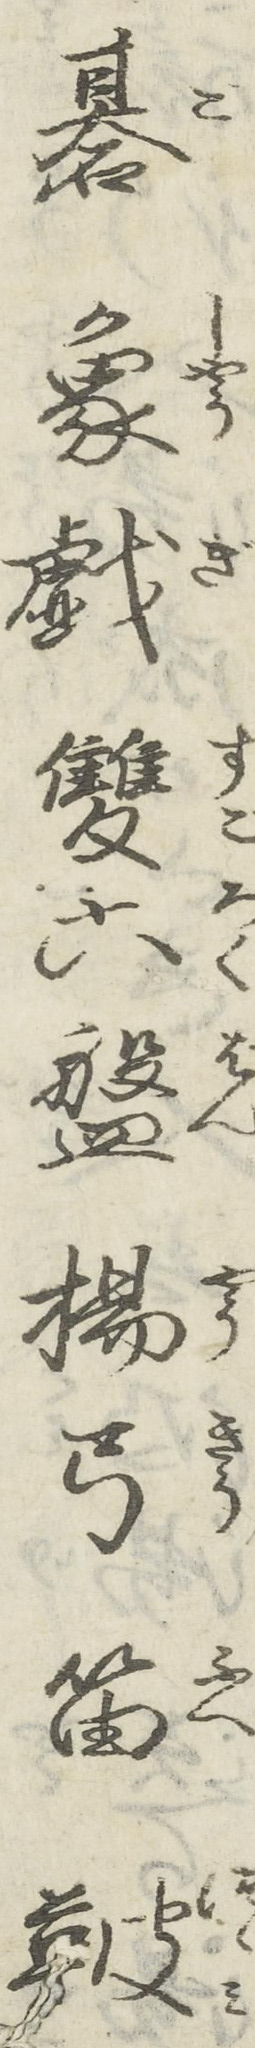碁象戯雙六盤楊弓笛皷
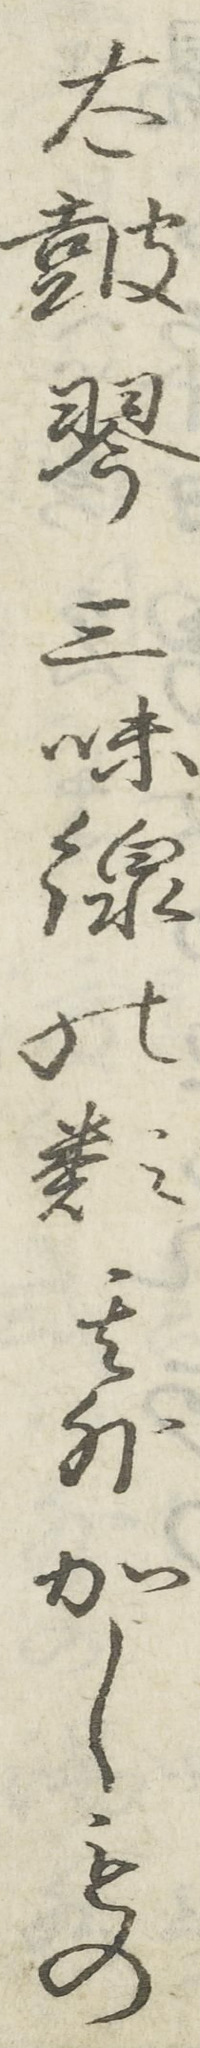太皷琴三味線の類其外かしもの
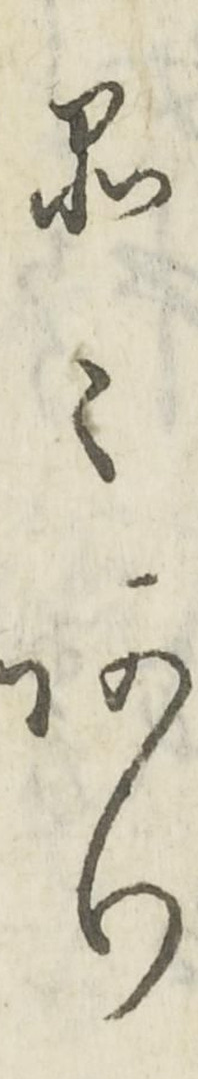品々あり
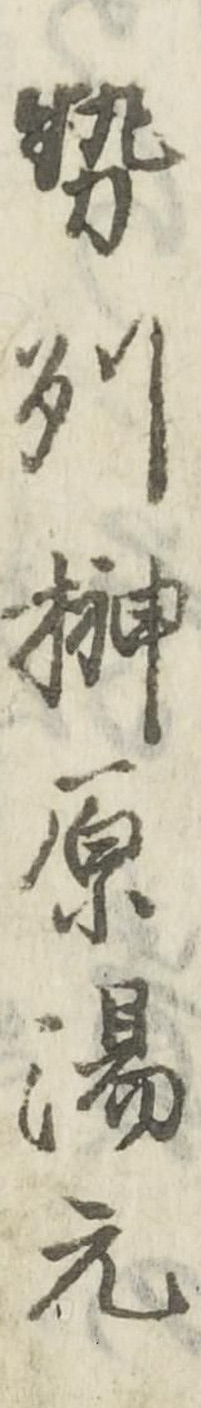勢州榊原湯元
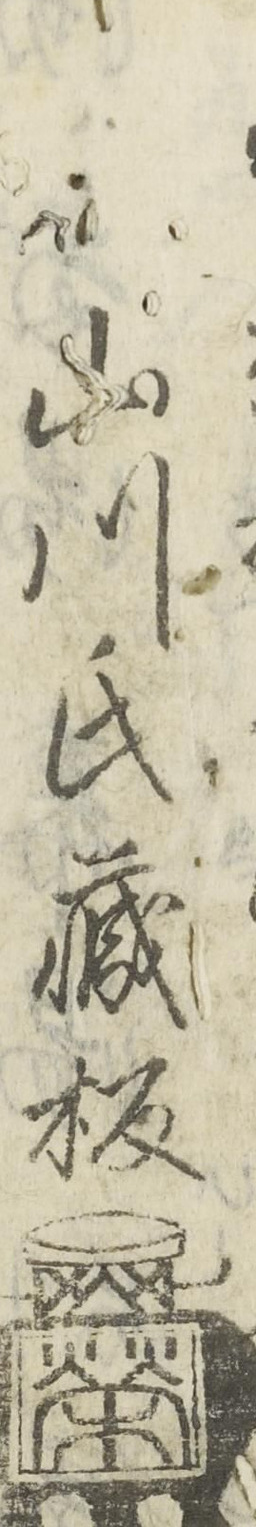山川氏蔵板
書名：温泉来由記
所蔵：東京大学地震研究所図書室 Earthquake Research Institute Library, The University of Tokyo, JAPAN
